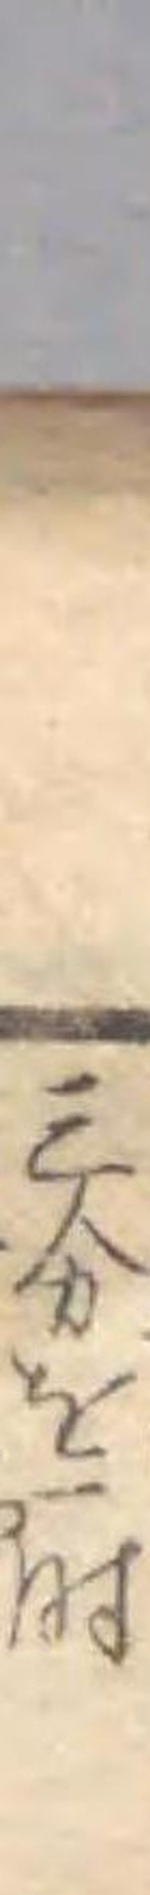三分を一時
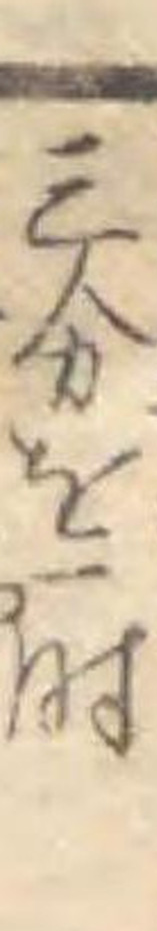三分を一時
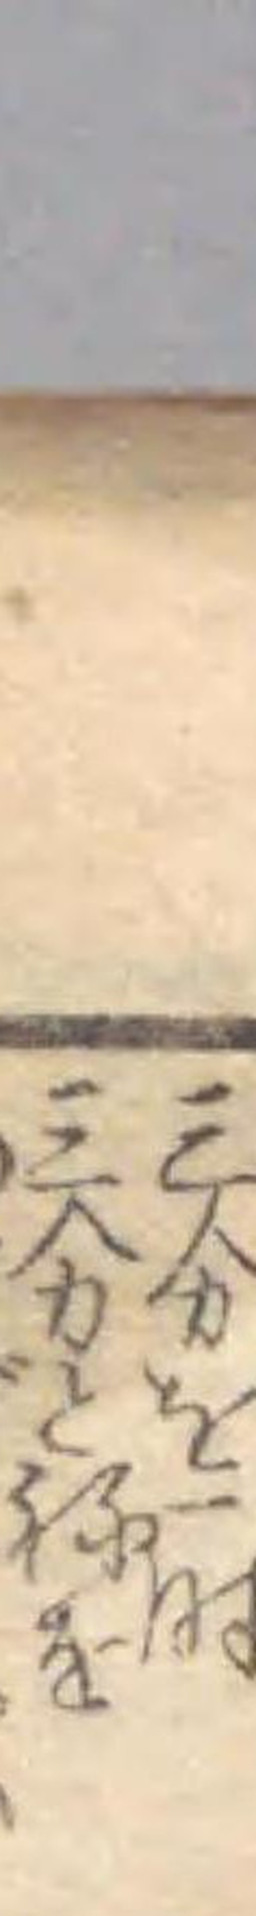三分とねを
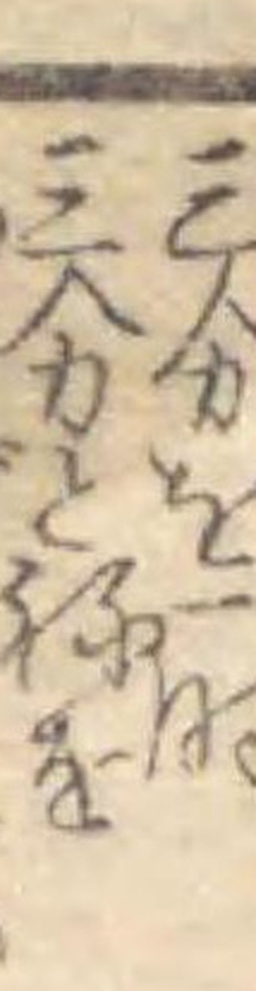三分とねを
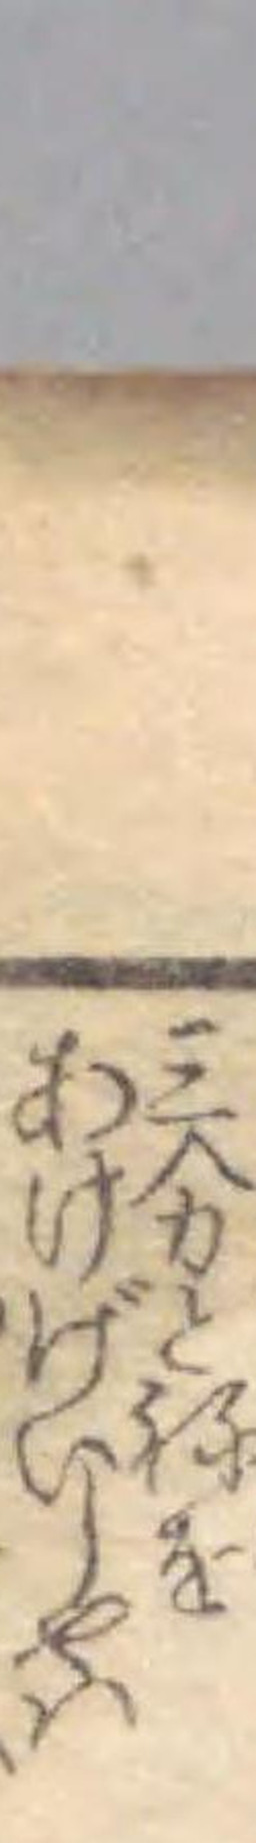あけげいしやは
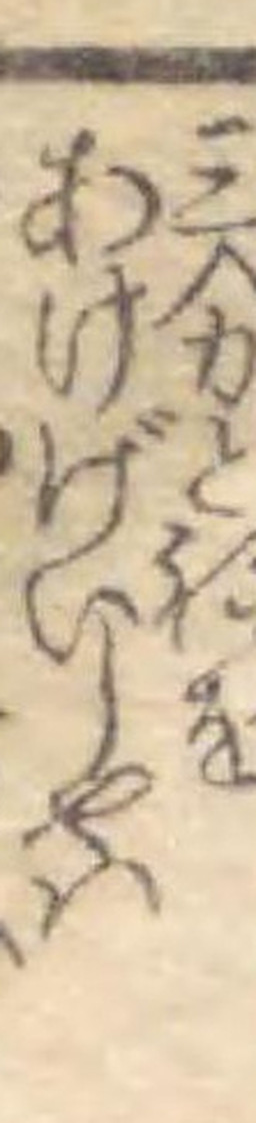あけげいしやは
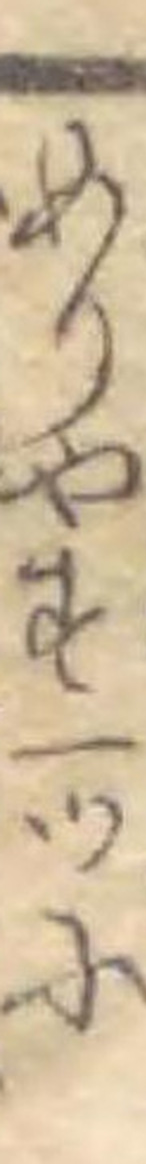めりやすを一つに
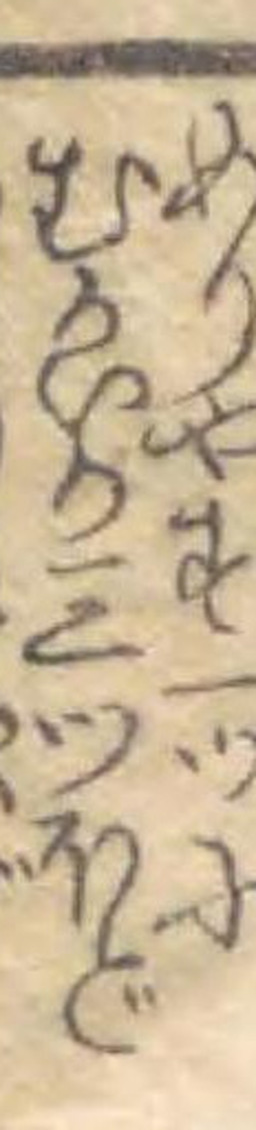むかいか三つほど
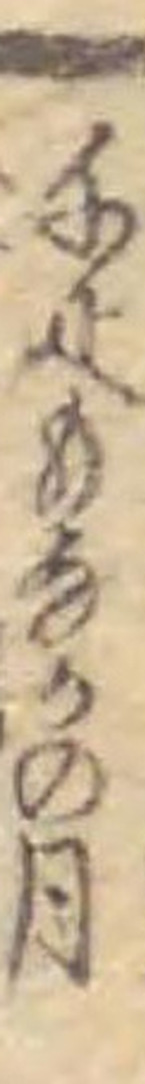千疋もなかの月
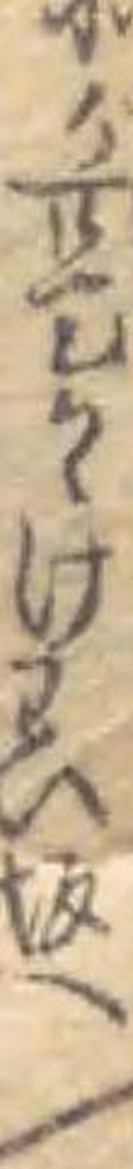〽是からけわい坂へ
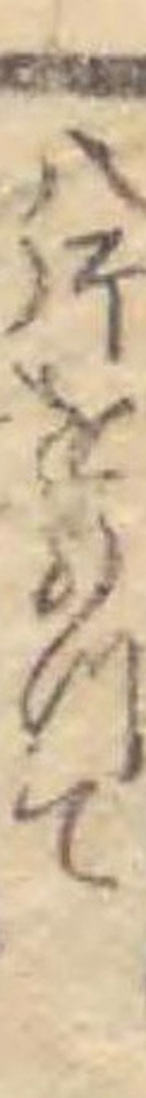八片をもつて
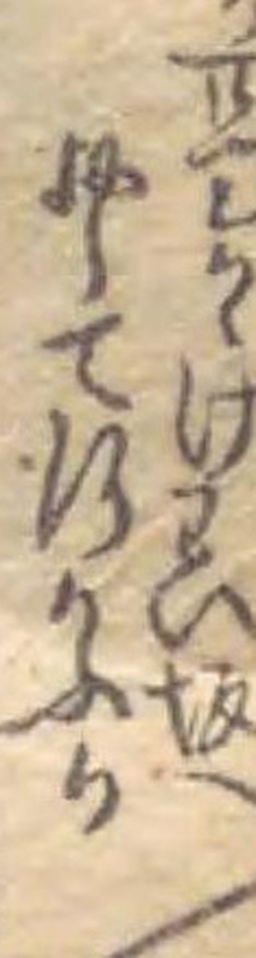おして行かふか
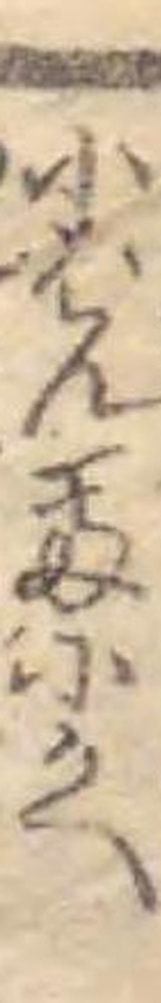小ばん一両にかへ
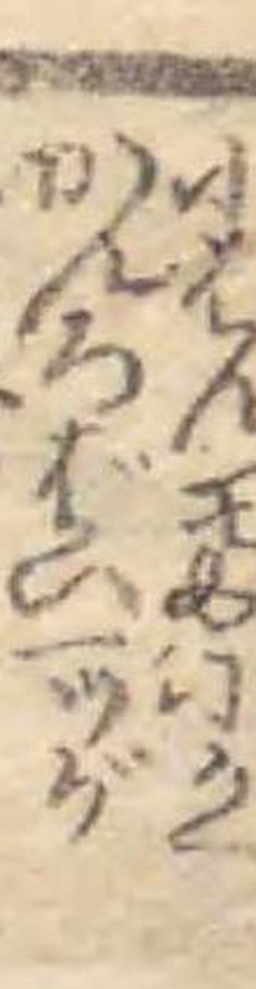かんろばい一つが
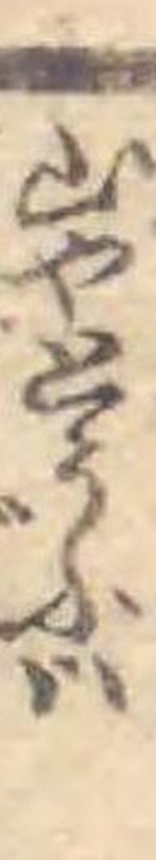山やとうふは
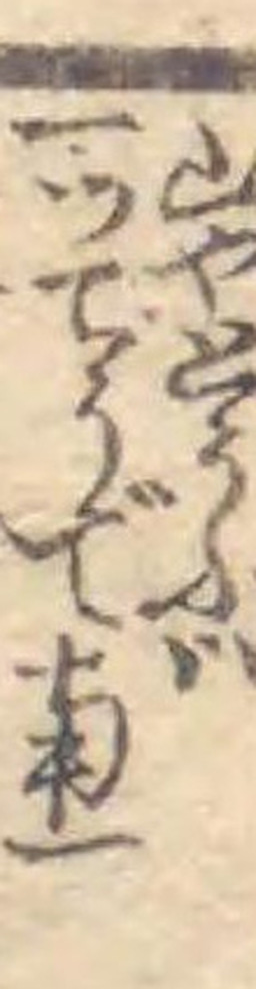一つてうで南一
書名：文武二道万石通 : 3巻
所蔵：国立国会図書館 National Diet Library, JAPAN
